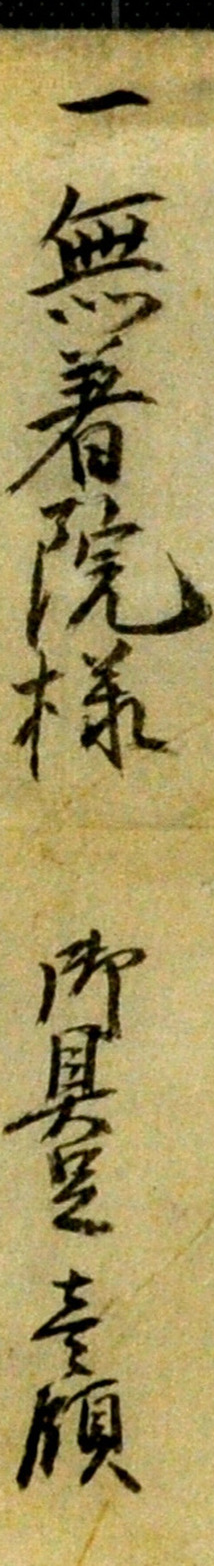一無着院様御具足壱領
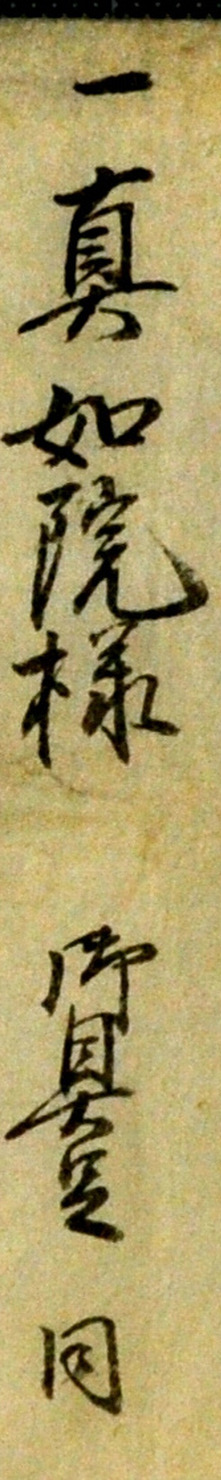一真如院様御具足同
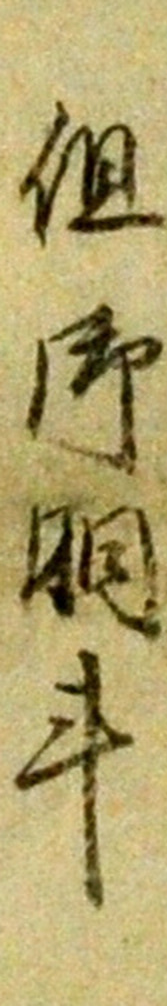但御胴斗
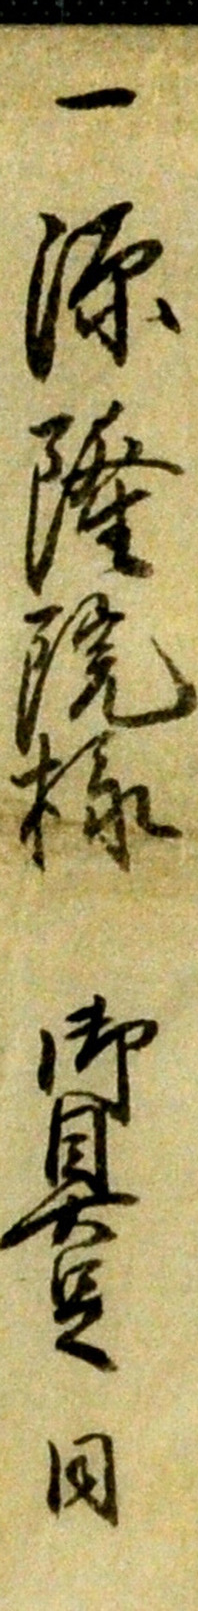一源隆院様御具足同
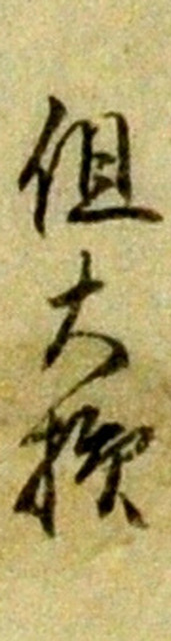但大様
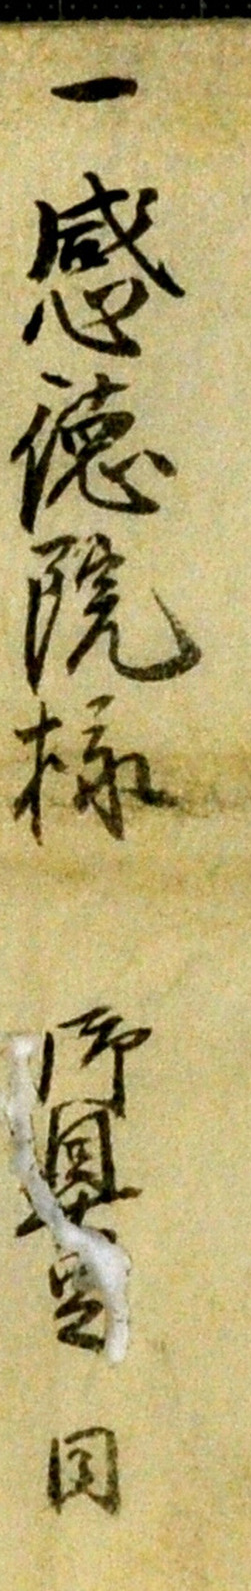一感徳院様御具足同
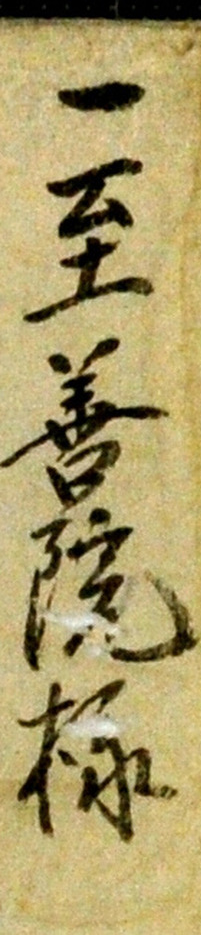一真如院様
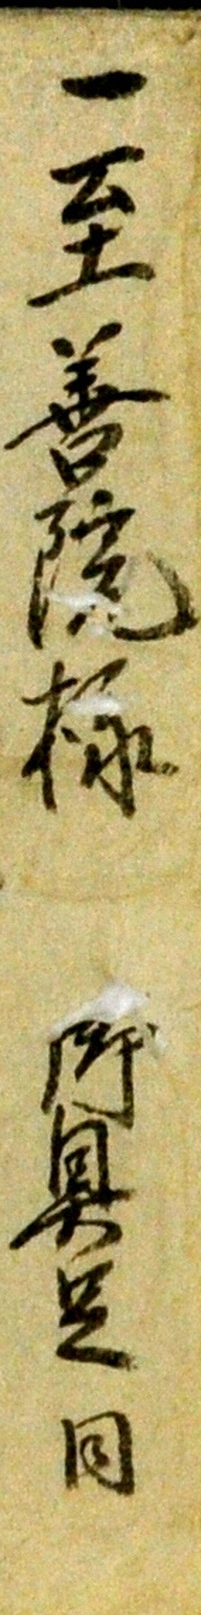一至善院様御具足同
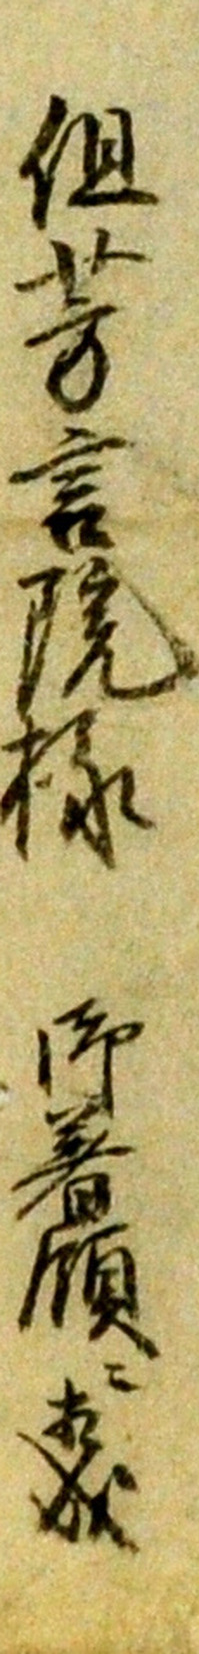但芳言院様御着領ニ相成
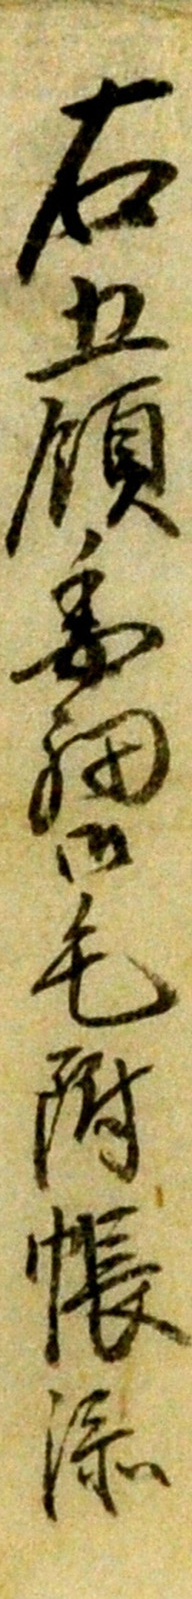右五領委細御毛附帳添
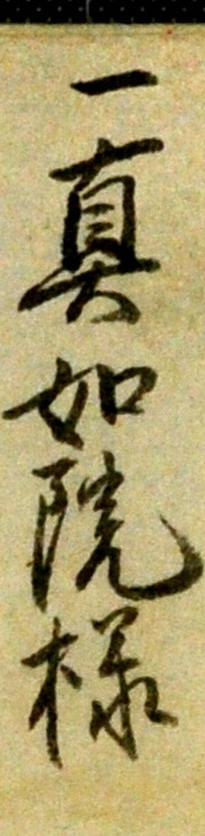一真如院様
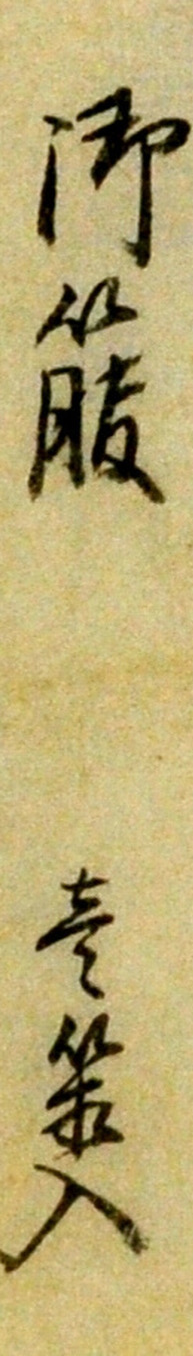御箙壱箱入
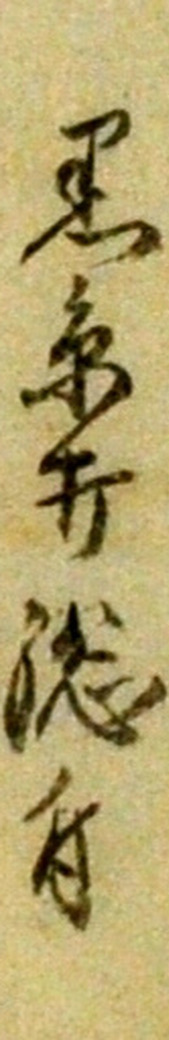黒糸打総付
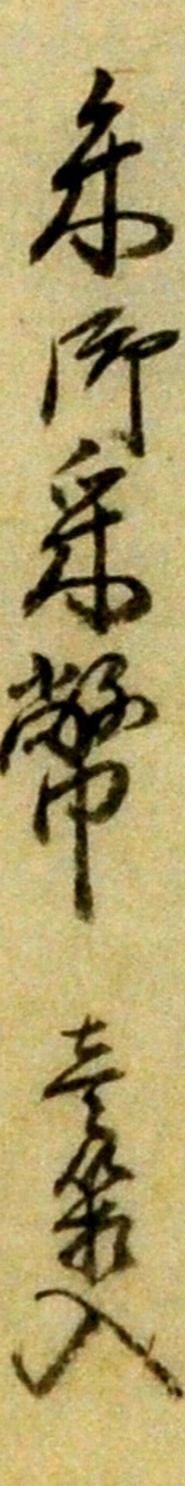朱御采幣壱箱入
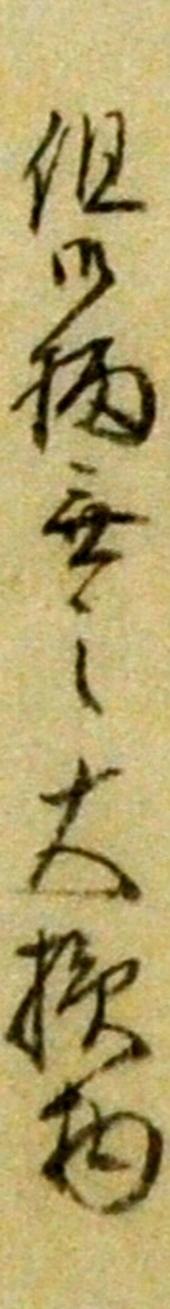但御柄無之大様物
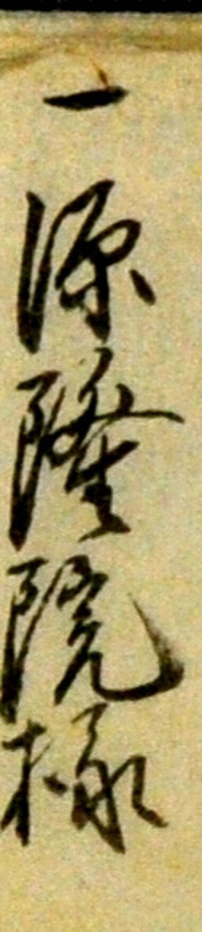一源隆院様
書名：目録
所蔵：伊那市立高遠町図書館・合同会社AMANE
